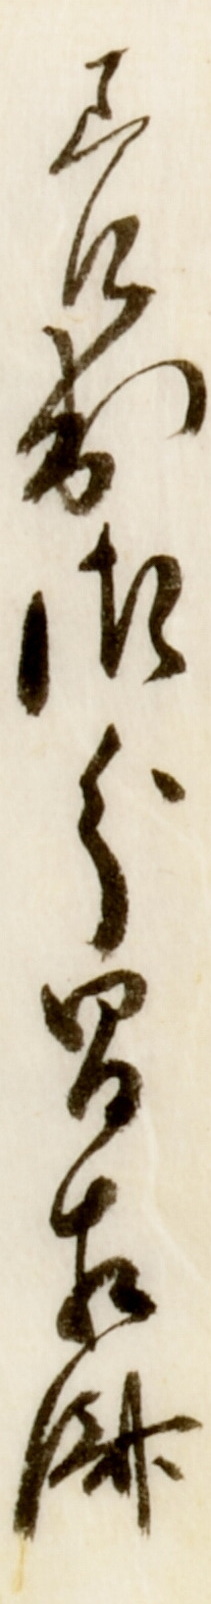差出御分間相済
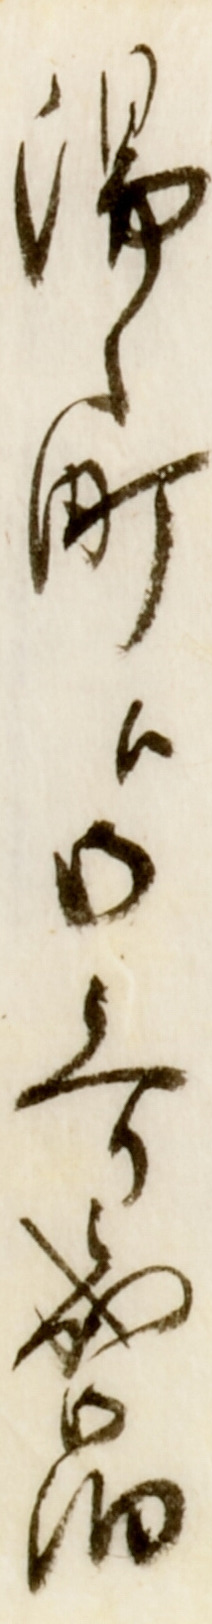湯之町江御上り被成御泊
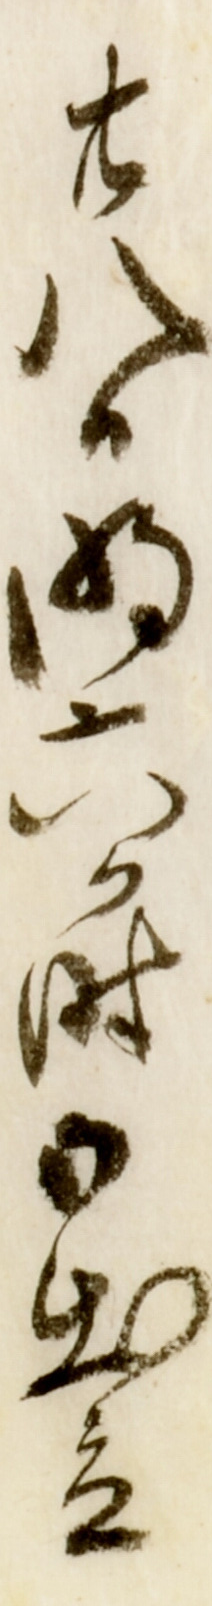廿八日明六ツ時御出立

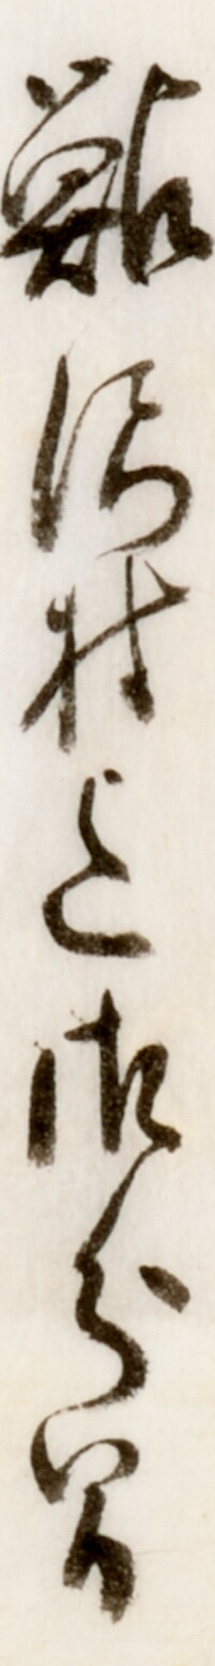鮎沢村迄御分間
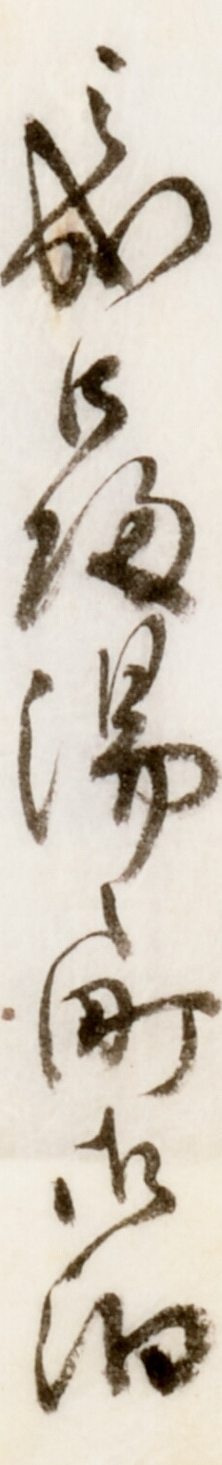被成御帰湯之町御泊
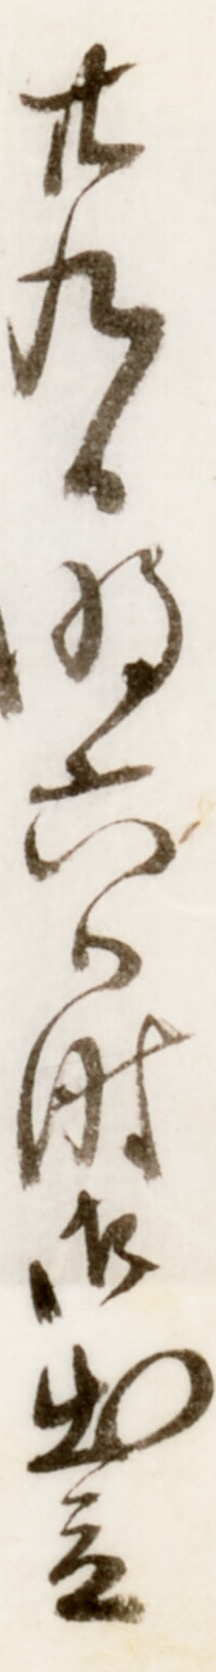廿九日明六ッ時御出立
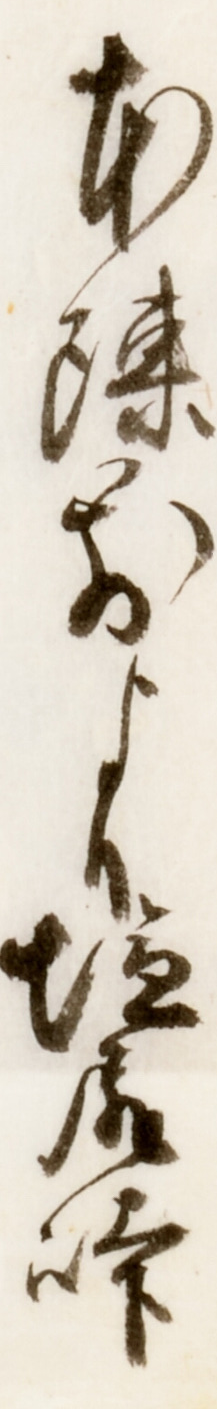本陣前より塩尻峠
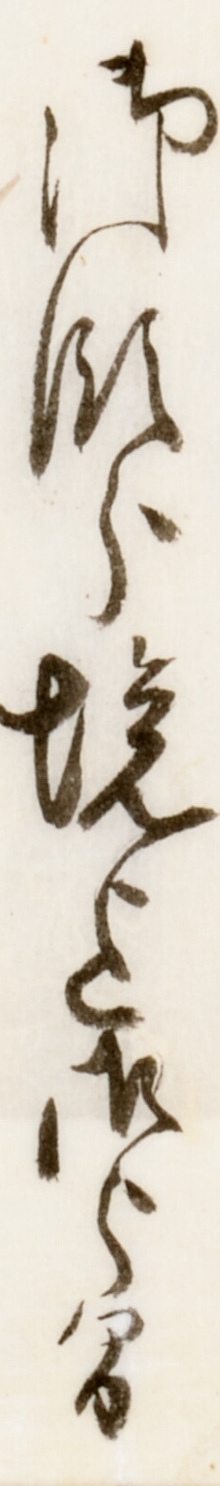御領分境迄御分間
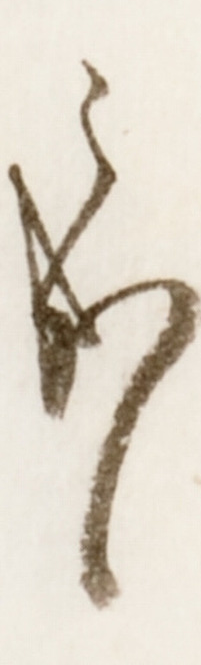被成候
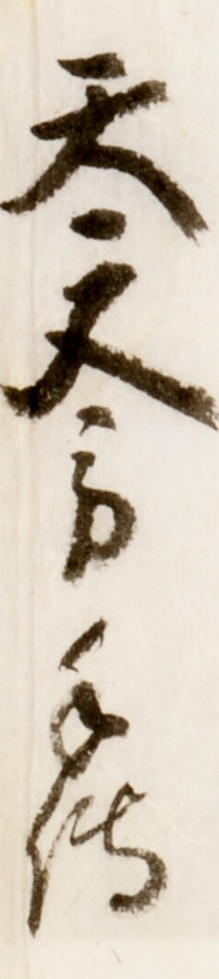天文方手伝
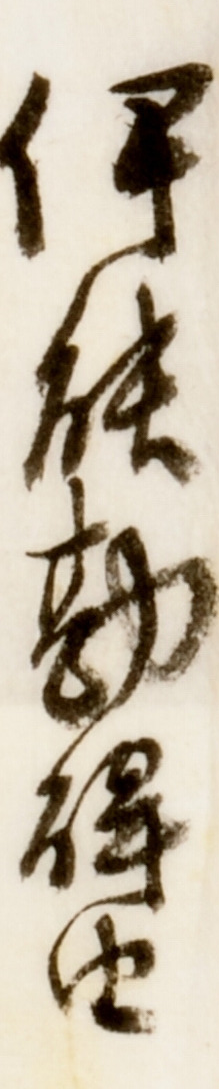伊能勘解由
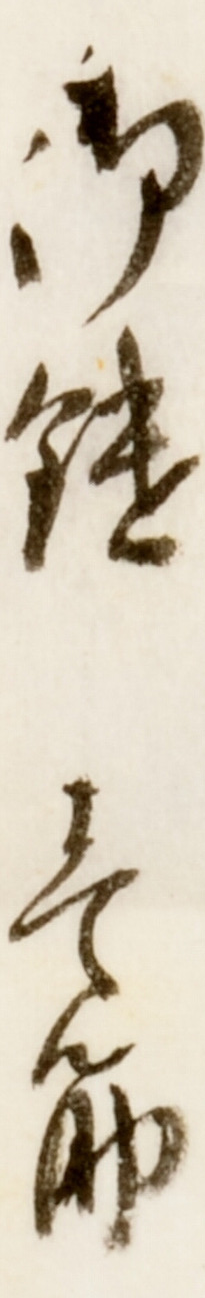御鑓壱筋
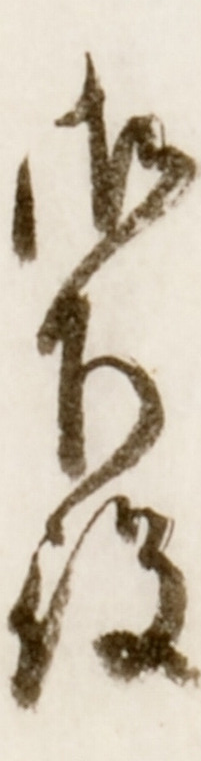御下役
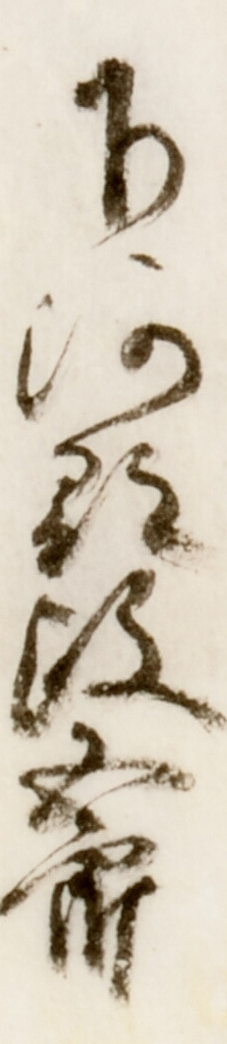下河部政五郎
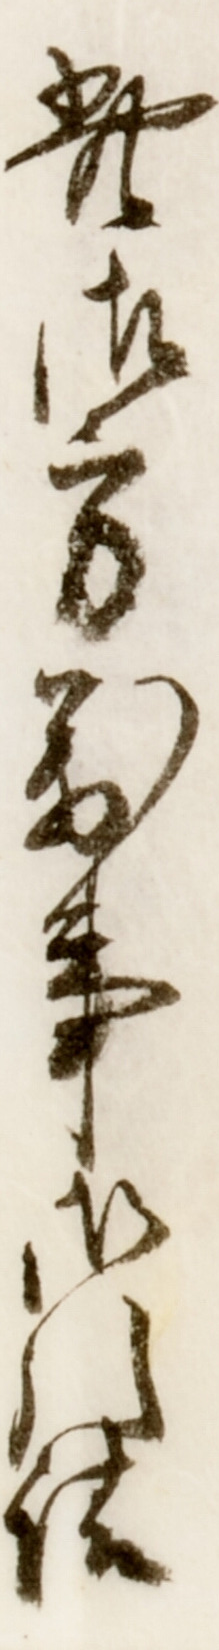此御方万事御引請
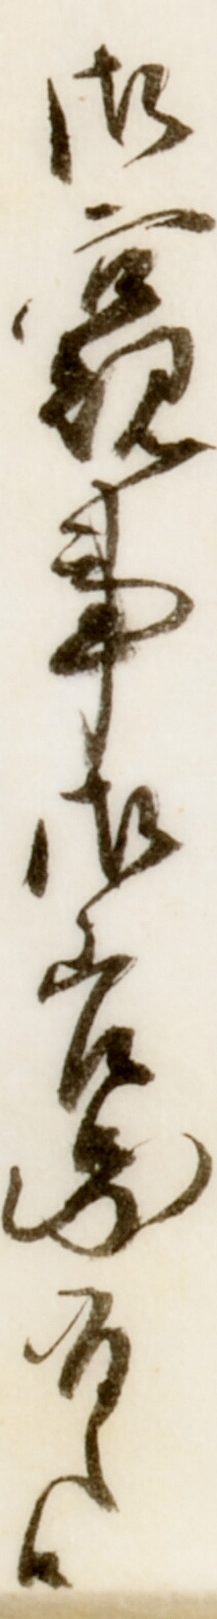御窺事御差図有之候
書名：覚
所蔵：伊那市立高遠町図書館・合同会社AMANE
